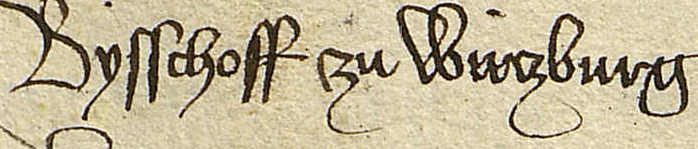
Byſchoff cʒu Wircʒburg
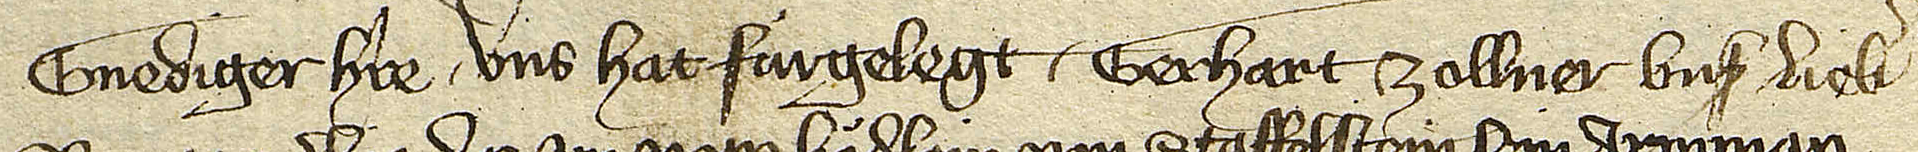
Gnediger h*re / Vns hat fürgelegt / Gerhart cʒollner vnſ* lieb*
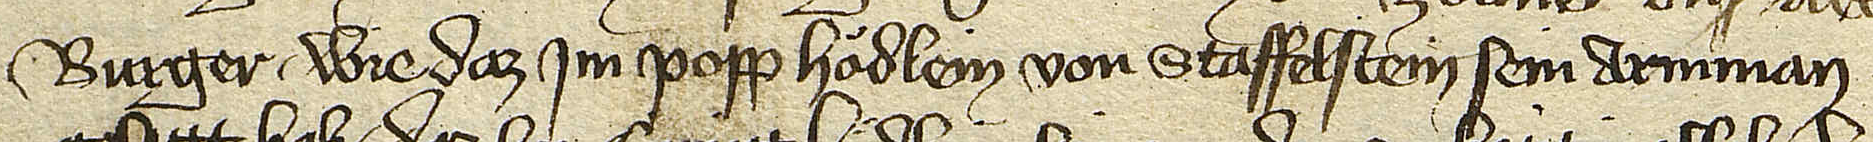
Burger / wie daʒ Im popp hödlein von Staffelſtein ſein Armman
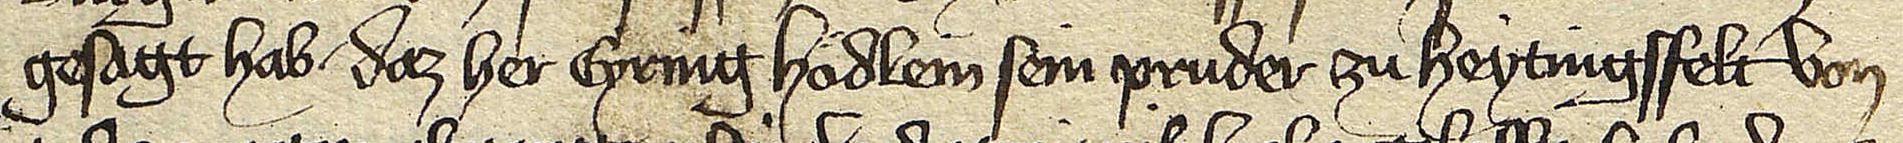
geſagt hab / daʒ her Eyring hödlein ſein pruder cʒu heytingſfelt von
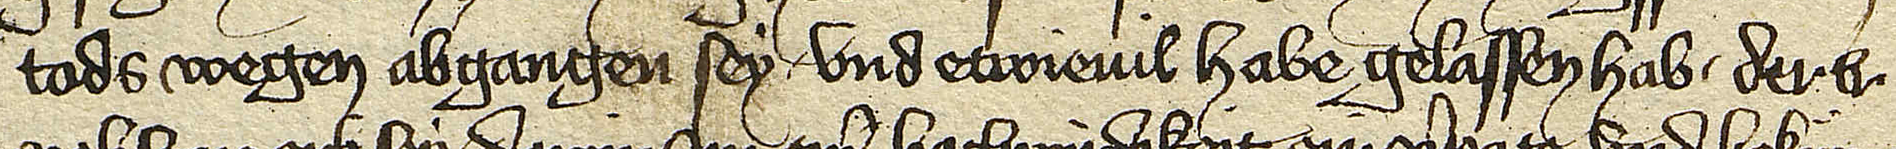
tods wegen abgangen ſey / vnd etwieuil habe gelaſſen hab / der Er
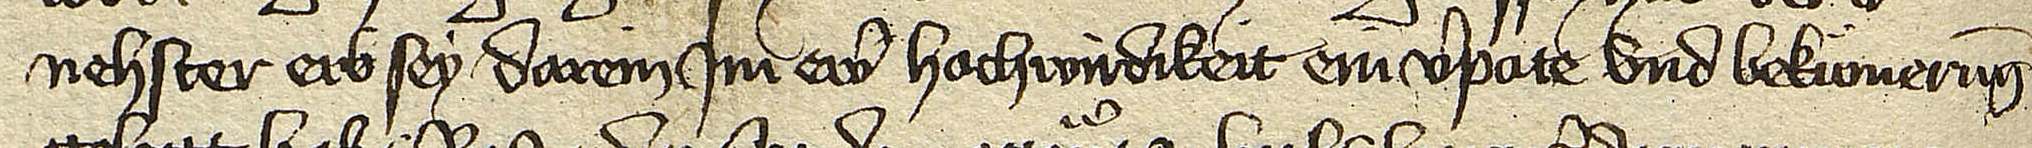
nehſter erb ſey / darein Im ew* hochwirdikeit ein v*pote vnd bekümerug*
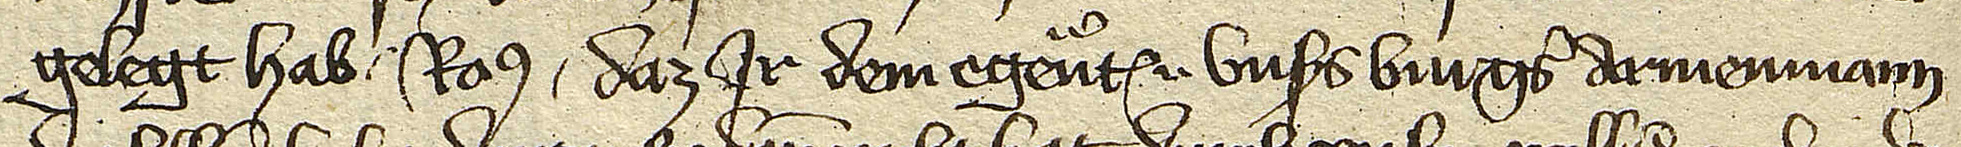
gelegt hab / Ro* / daʒ Ir dem egen*t* ~ vnſ*s burgs* Armenmann
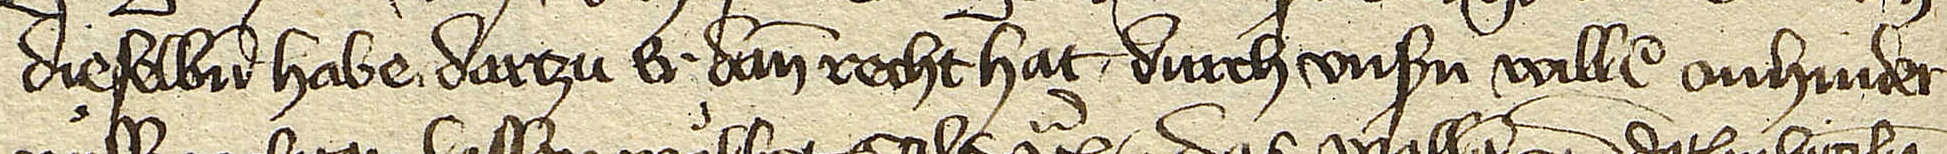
dieſelbn* habe darcʒu Er dan* recht hat / durch vnſ*n wille onhinder
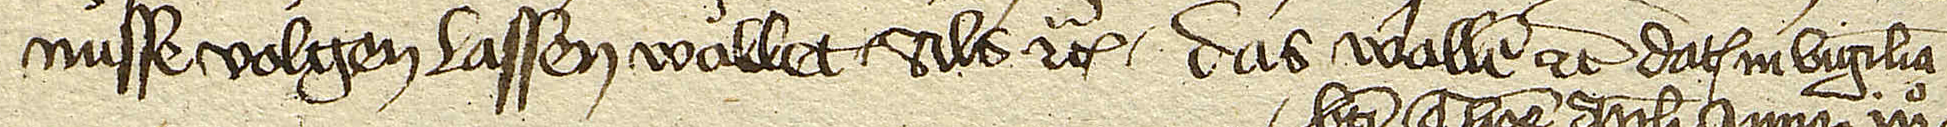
nüſſe volgen laſſen wöllet / Als ec* / das wolle* ec* dat* in vigilia*
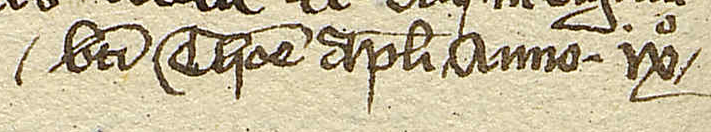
/ bti* Thoe* Apli* / Anno - ix* /
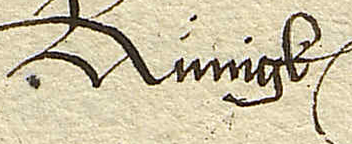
Künigk
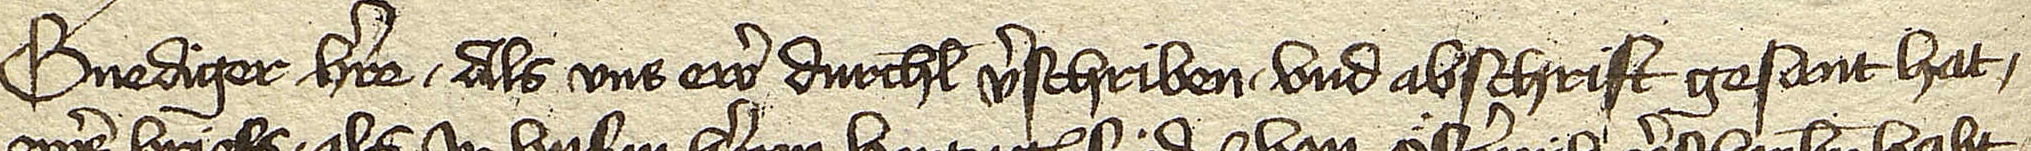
Gnediger h*re / Als vns ew* durchl* v*ſchriben / vnd abſchrift geſant hat /
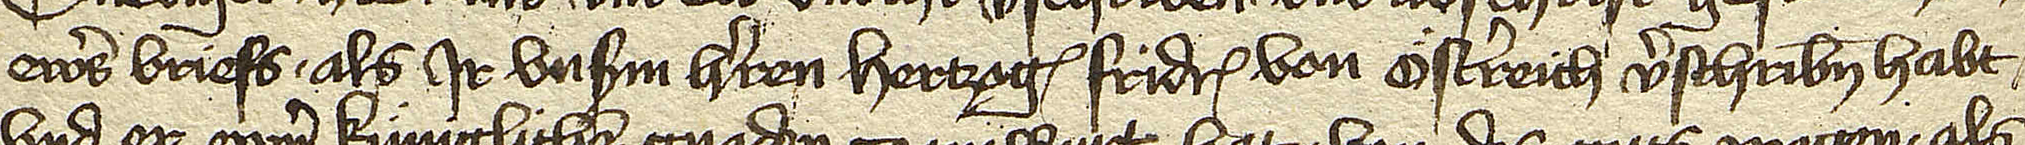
ews* briefs / als Ir vnſ*m h*ren hertʒog* fridr* von Öſt*reich v*ſchribn* habt /
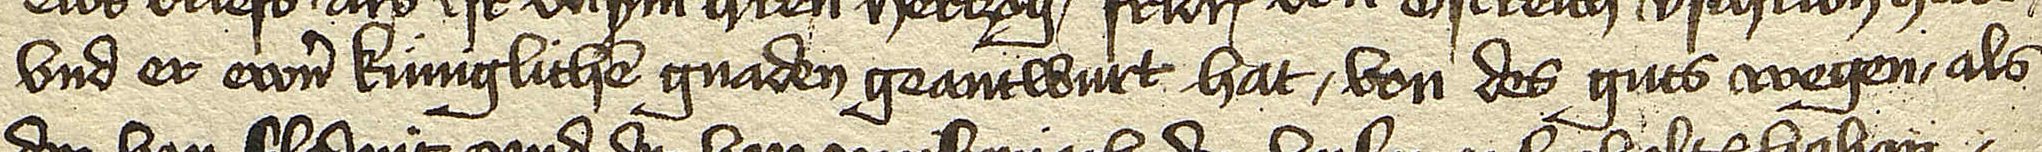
vnd er ewn* künigliche* gnaden geantwurt hat / von des guts wegen / als
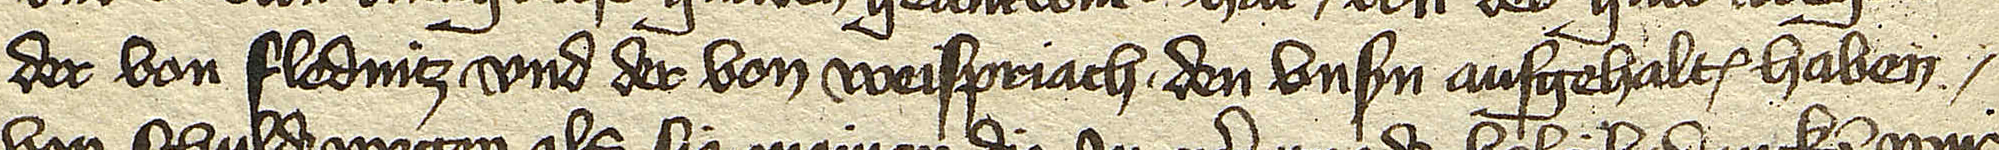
der von flednicʒ vnd der von weiſpriach / den vnſ*n aufgehalt* haben /
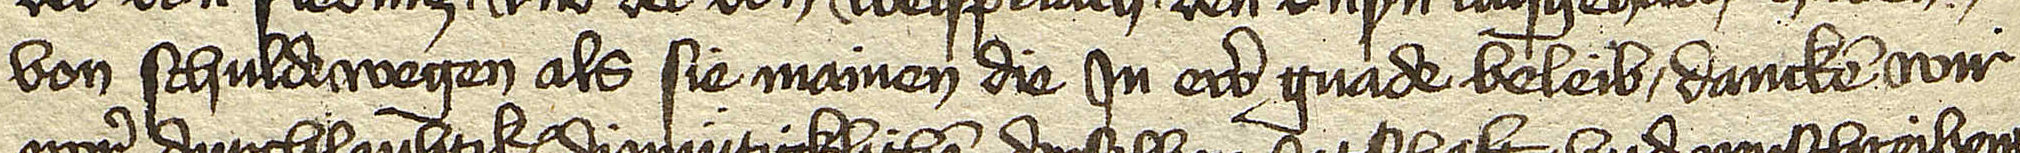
von ſchulde wegen als ſie mainen die In ew* gnade beleib / dancke* wir
